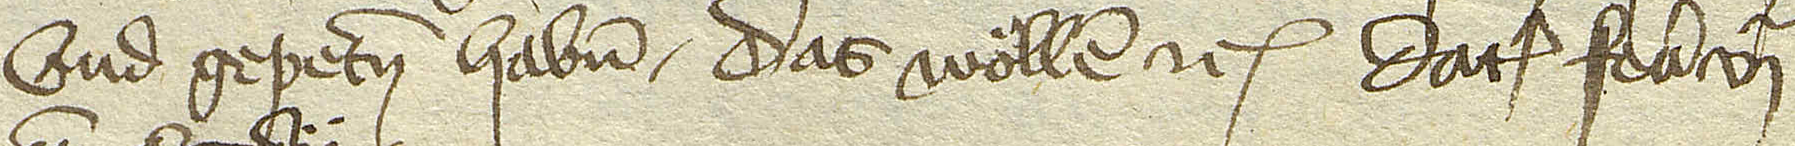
vnd gepetn* habn* / Das wölle* ec* dat* fea* vi*
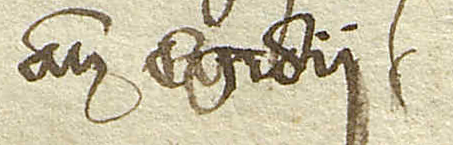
an* Egidii /
